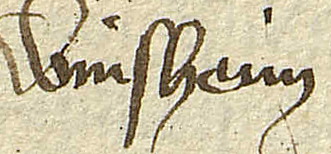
Winſheim
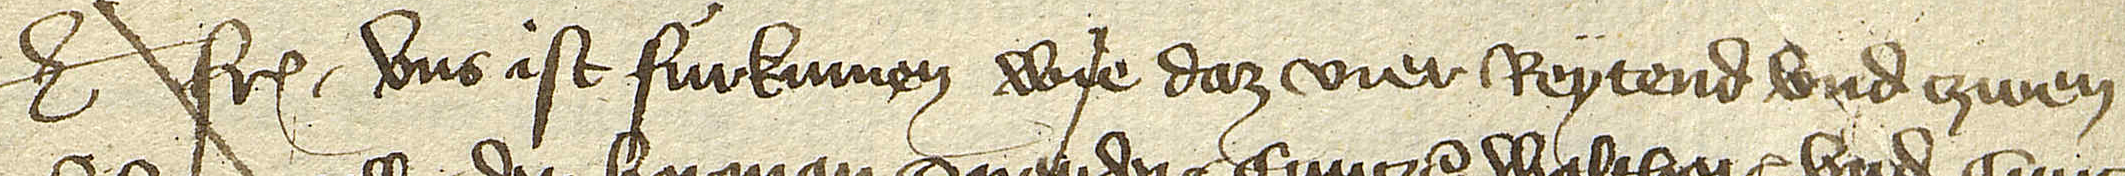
L* fr* / vns iſt fürkumen wie daʒ vier Reytend vnd cʒwen
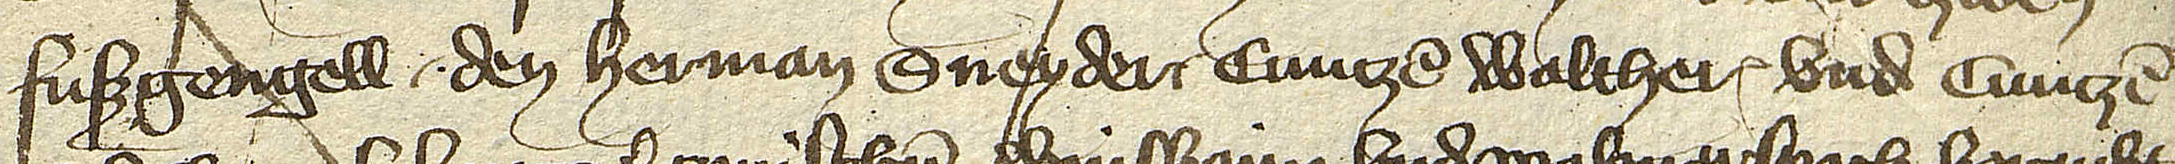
fuſʒgengell / den herman Sneyder / Cuncʒe* walther vnd Cuncʒe*
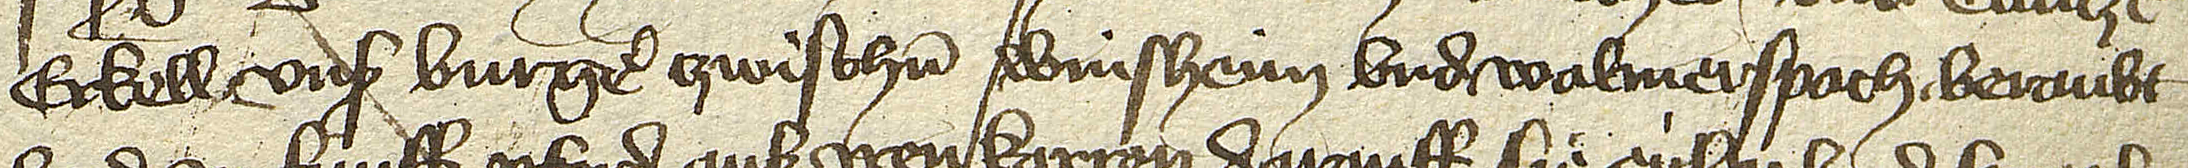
Erkell vnſ* burge* cʒwiſchn* winſheim vnd wolmerſpach / beraubt
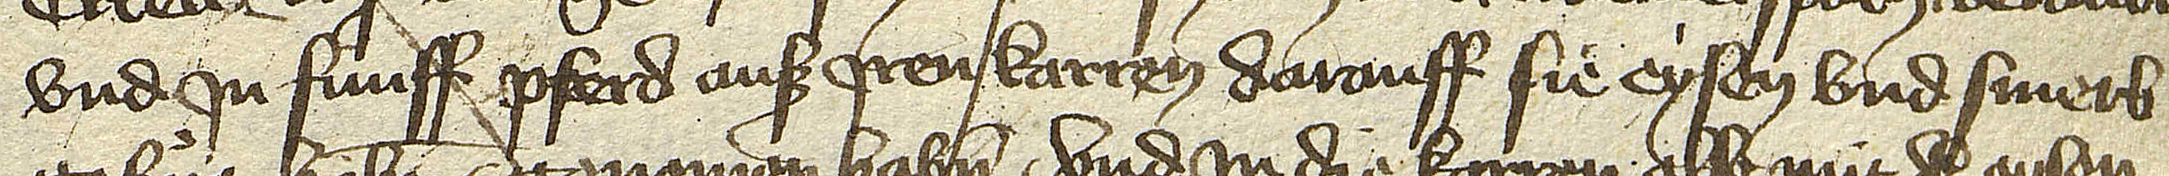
vnd In fünff pferd auſʒ Iren karren darauff ſie eyſen vnd ſmerb
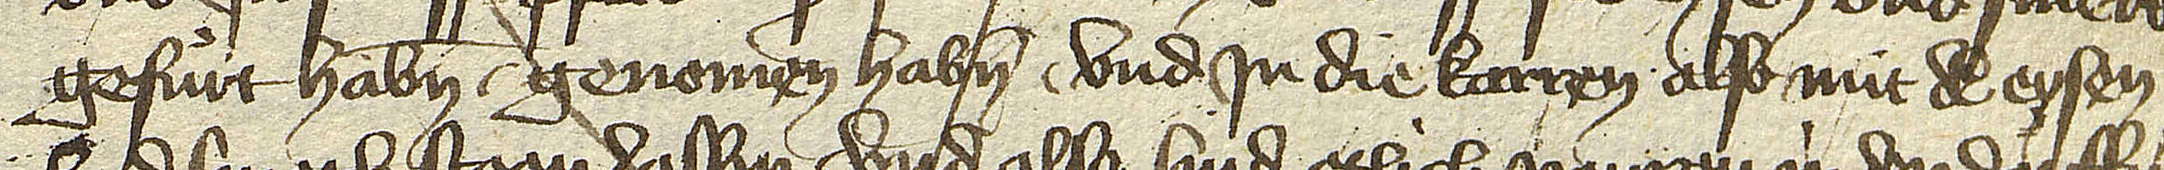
gefürt habn* / genomen habn* / vnd In die karren alſo mit d* eyſen
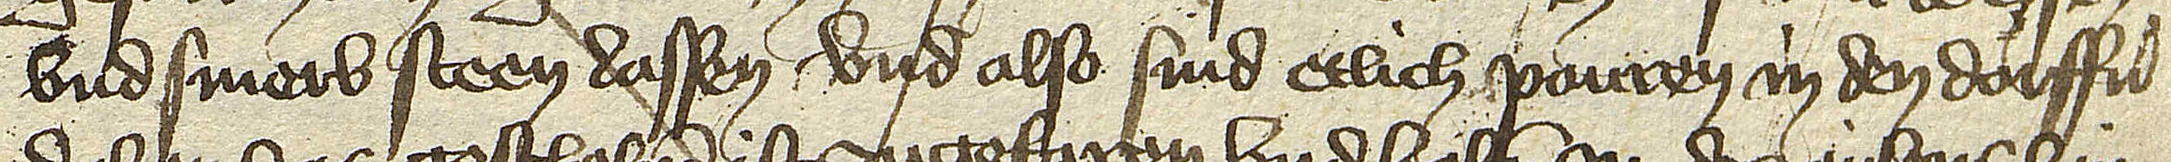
vnd ſmerb ſteen laſſen / vnd alſo ſind etlich pauren in den dörffn*
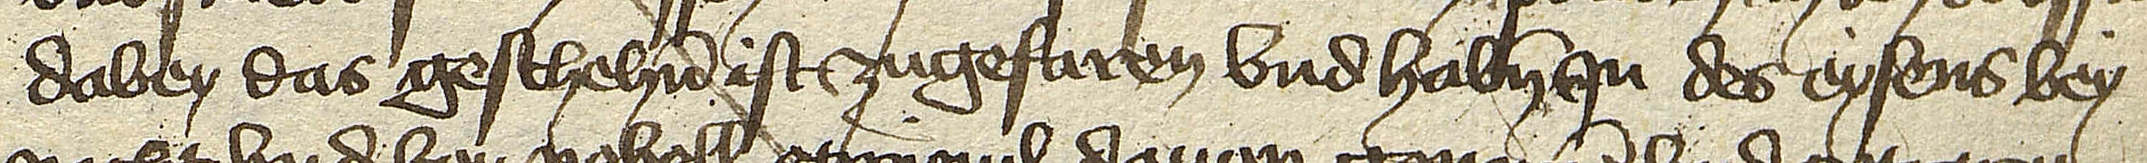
dabey das geſchehn* iſt cʒugefaren vnd habn* In des eyſens bey
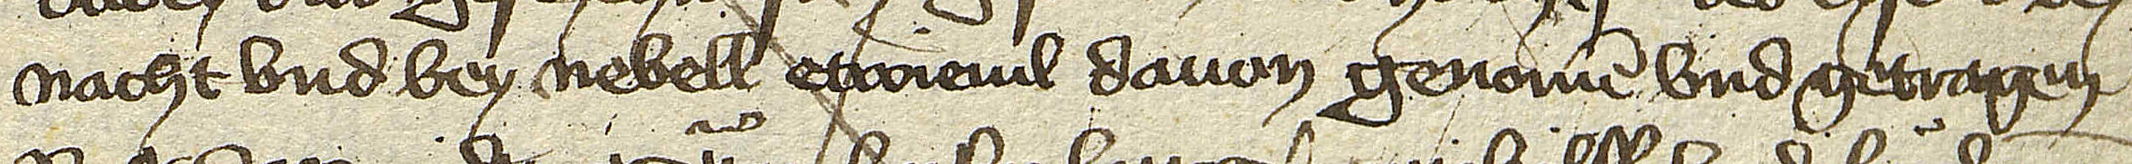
nacht vnd bey nebell etwieuil dauon genome* vnd getragen
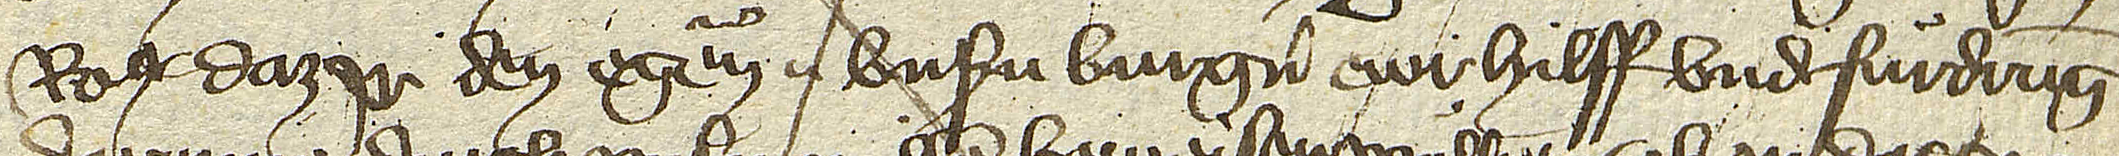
Ro* / daʒ Ir den egen* ~ vnſ*n burgn* ewr hilff vnd fürdrug*
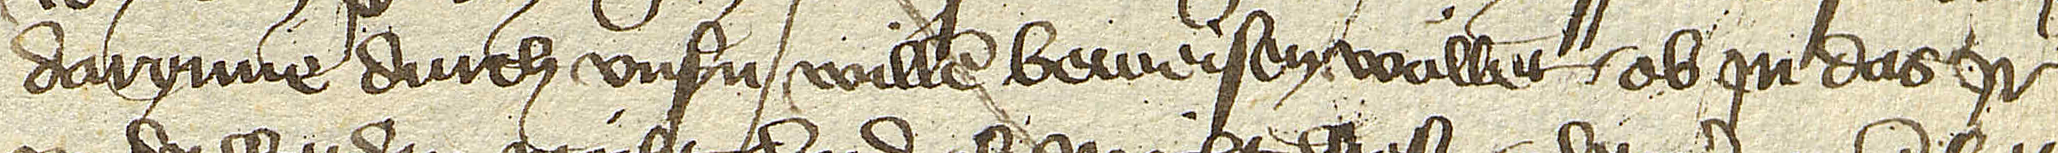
darynne durch vnſ*n wille* beweiſen wöllet / ob In das Ir
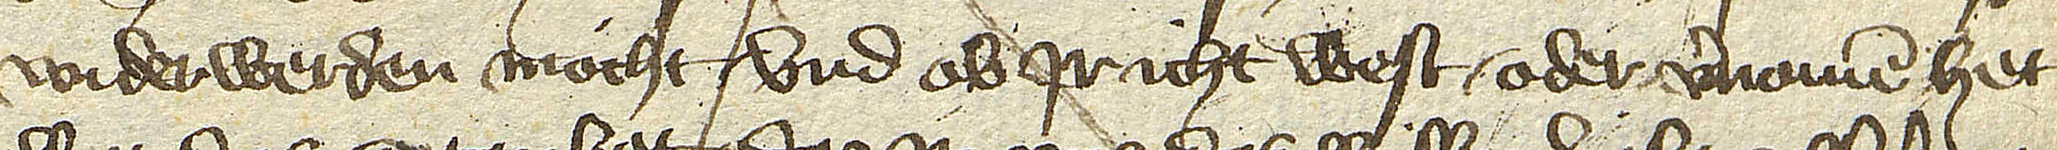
widerwerden möcht / vnd ob Ir icht weſt / oder v*nome* het
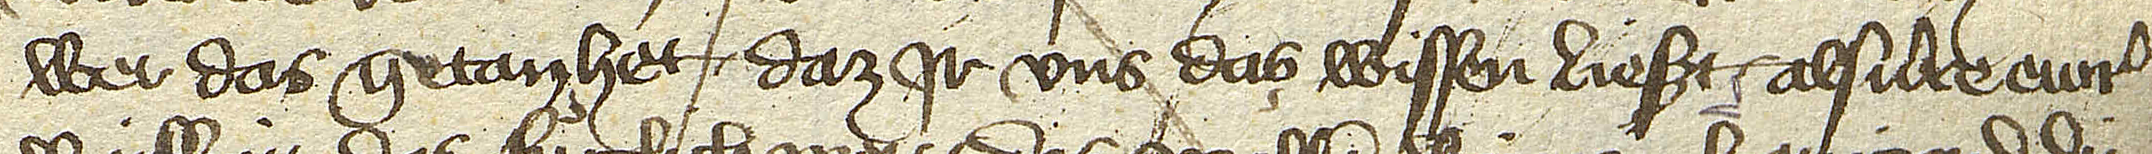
wer das getan het / daʒ Ir vns das wiſſen lieſʒt / alſu*re ewr*
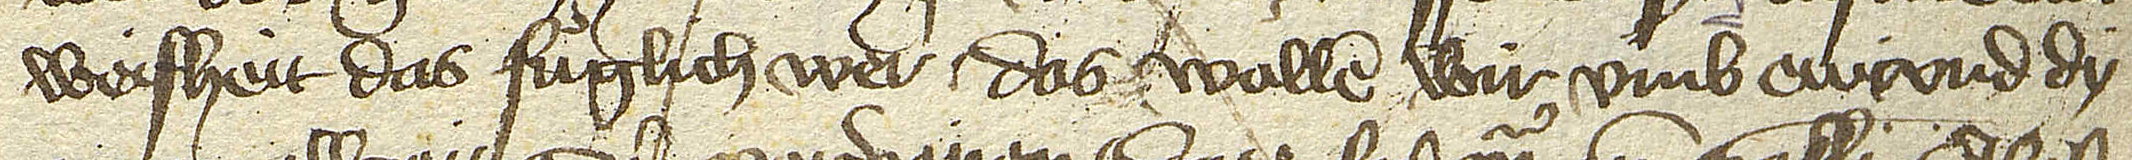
weiſheit das füglich wer / das wolle* wir vmb ew vnd dy
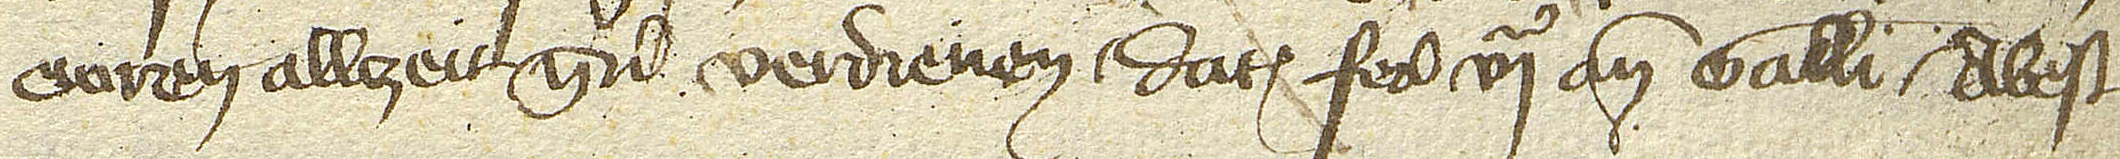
ewren allcʒeit gn* verdienen / dat* fea* vi* an* Galli* / Abeſt
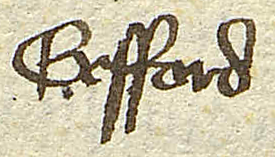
Erfford
